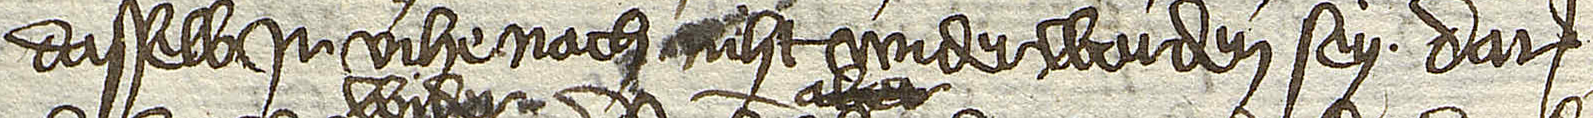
daſſelb Ir vihe nach niht wider worden ſey . Dar*
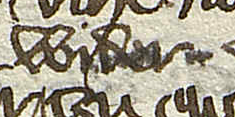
wider
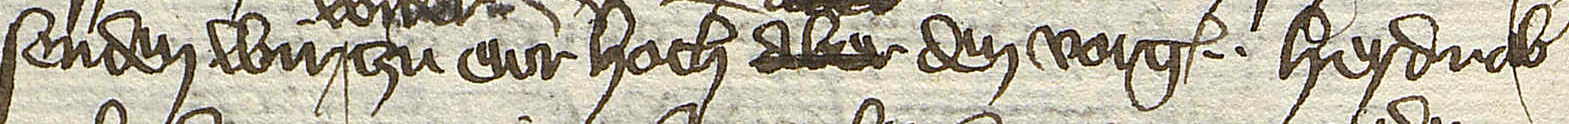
ſenden wir cʒu ewr* hoch* aber den vorg* ~ heydnab*
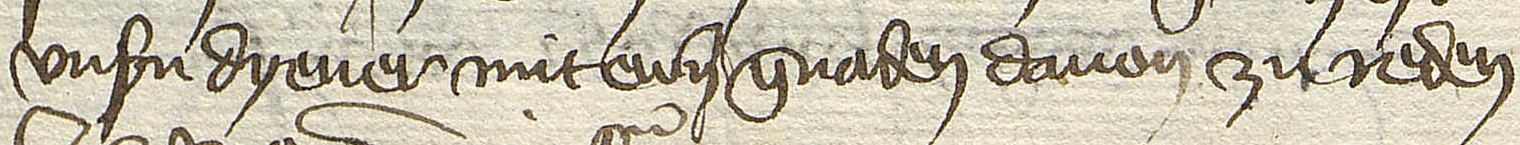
vnſ*n dyener mit ewn* gnaden dauon cʒu reden
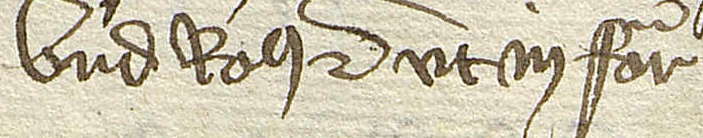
vnd Ro* ec* vt in for*
